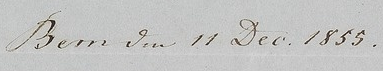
Bern den 11 Dec. 1855.
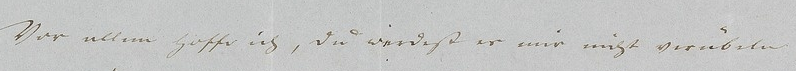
Vor allem hoffe ich, Du werdest es mir nicht verübeln,
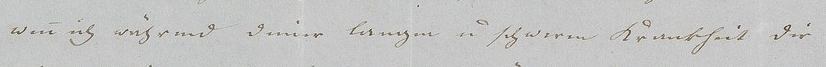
wenn ich während deiner langen u schweren Krankheit Dir
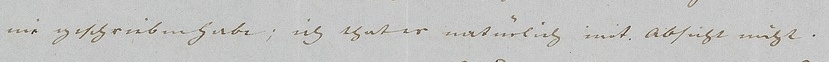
nie geschrieben habe; ich that es natürlich mit Absicht nicht.
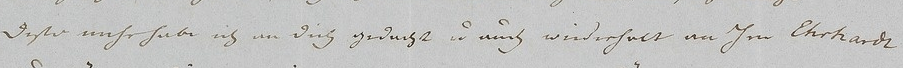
Desto mehr habe ich an dich gedacht u auch wiederholt an Hrn Ehrhardt
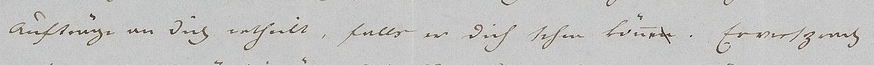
Aufträge an dich ertheilt, falls er dich sehen können. Er versprach
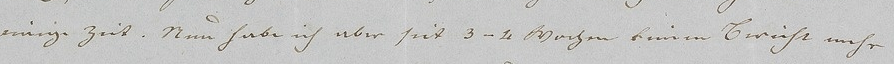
einige Zeit. Nun habe ich aber seit 3–4 Wochen keinen Bericht mehr
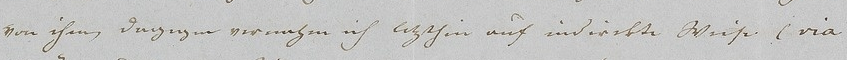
von ihm, dagegen vernahm ich letzthin auf indirekte Weise (via
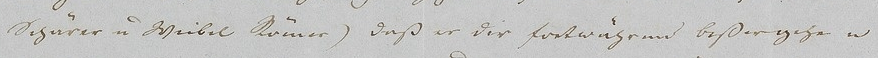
Schärer u Weibel Römer ) daß es dir fortwährend beßer gehe u
